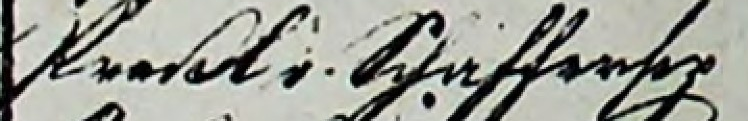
Praßl v. Schaffersez
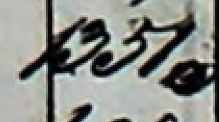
1351.0
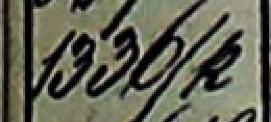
1336/2
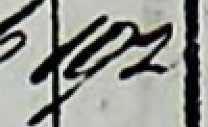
192
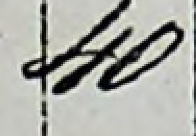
40
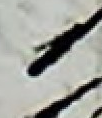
1
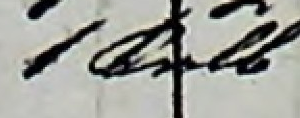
1 Kalb
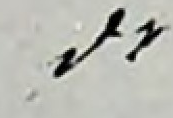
do
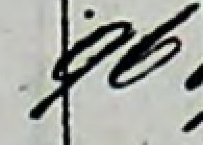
96
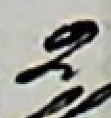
2
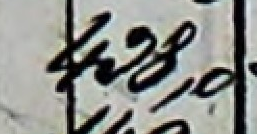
438,0
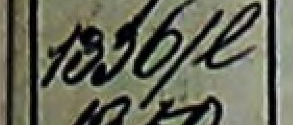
1336/l
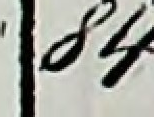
84
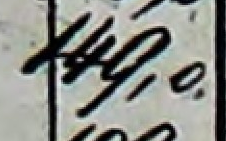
149,0
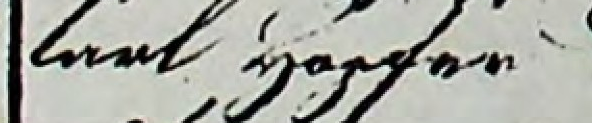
Carl Hopfer
